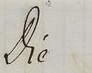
hat
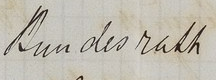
Bundesrath
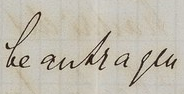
Betheiligten
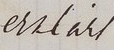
hat seine
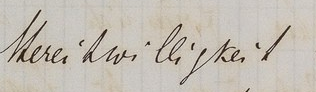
Bereitwilligkeit
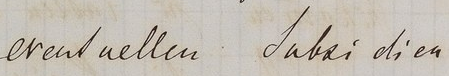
eventuellen Subsidien
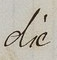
der
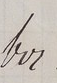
aarg.
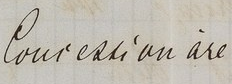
Concessionäre zu
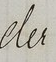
Vor-
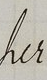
noch
